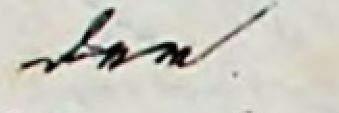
der
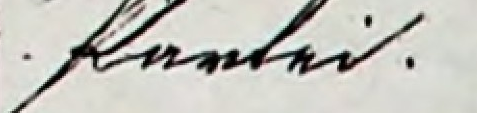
Partei.
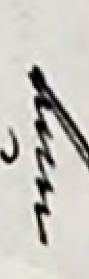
ung
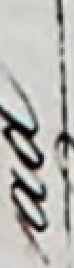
ad
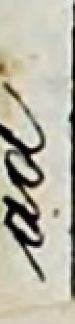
ad
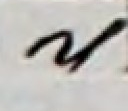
J.
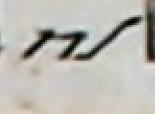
K.
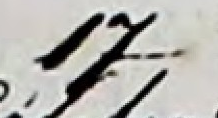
17
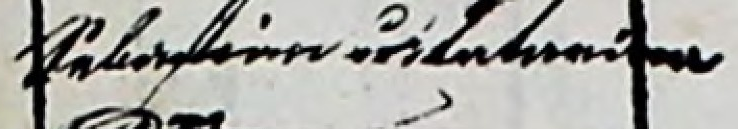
Sebastian u. Catarina
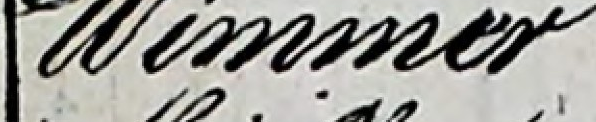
Wimmer
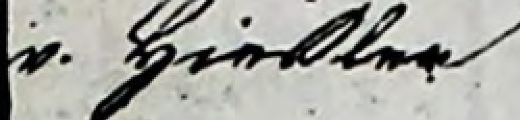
v. Hiekler
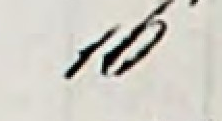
16
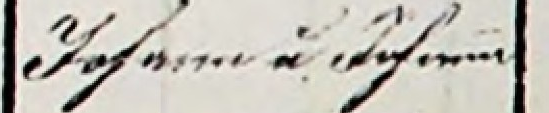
Johann und Johanna
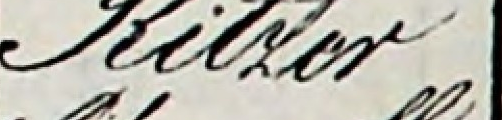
Kitzer
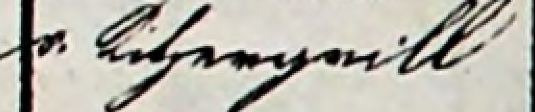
v. Kitzergrill
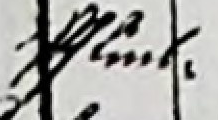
Pflinds„
